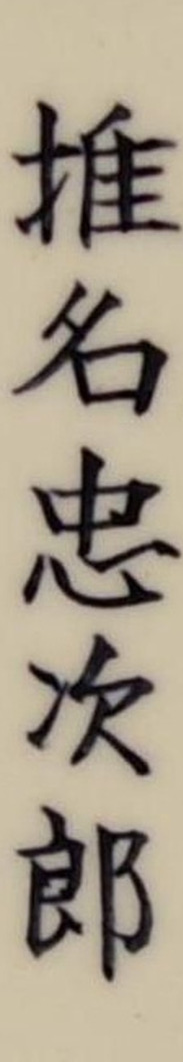椎名忠次郎
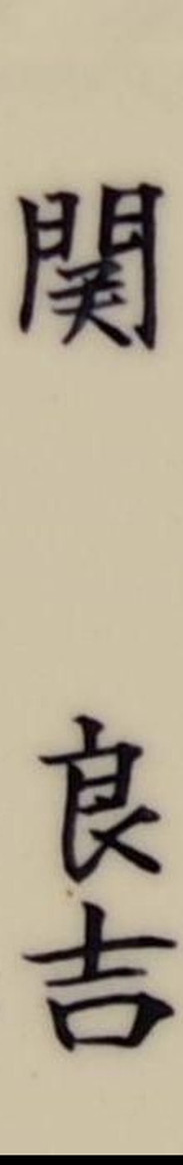関良吉
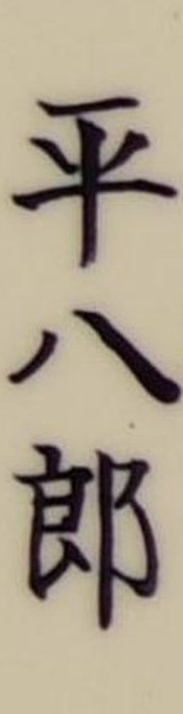平八郎
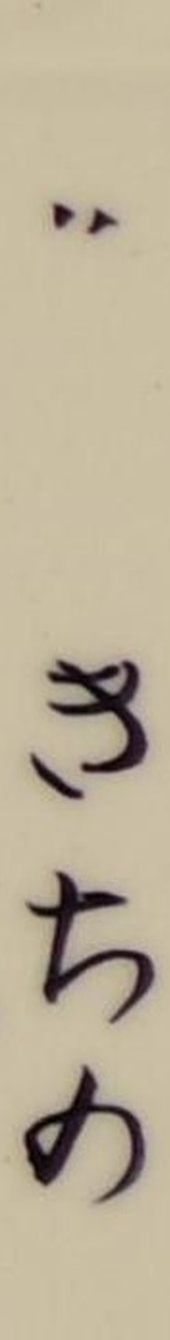きちの
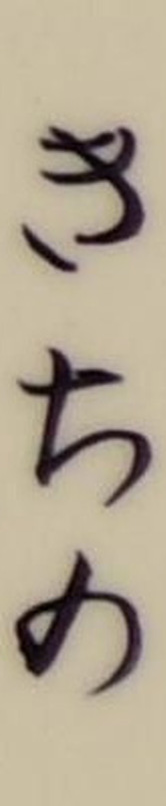きちの
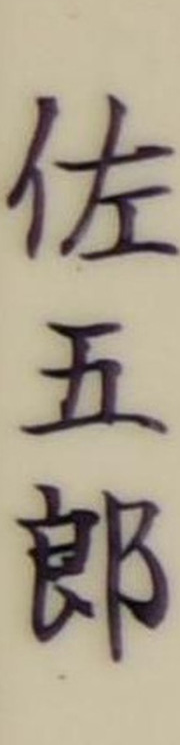佐五郎

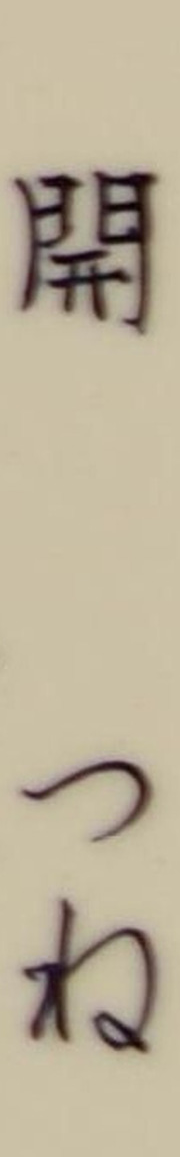開つね
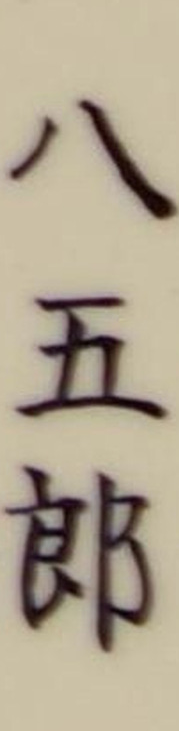八五郎
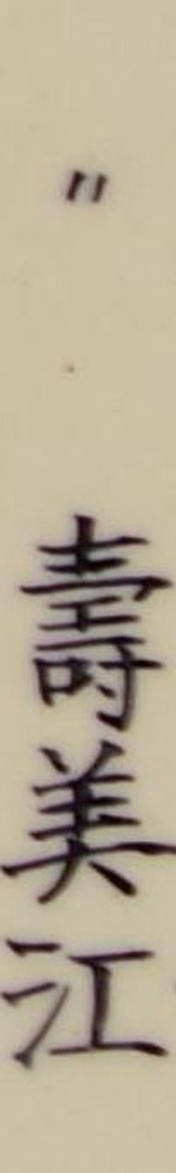壽美江
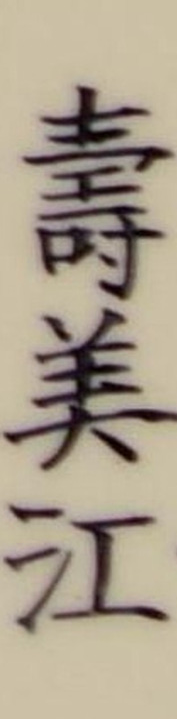壽美江
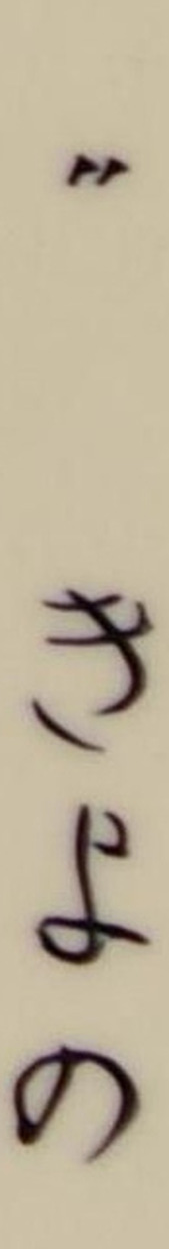きよの
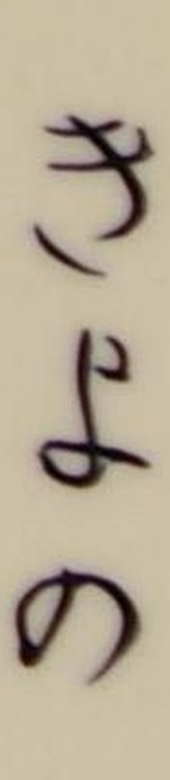きよの
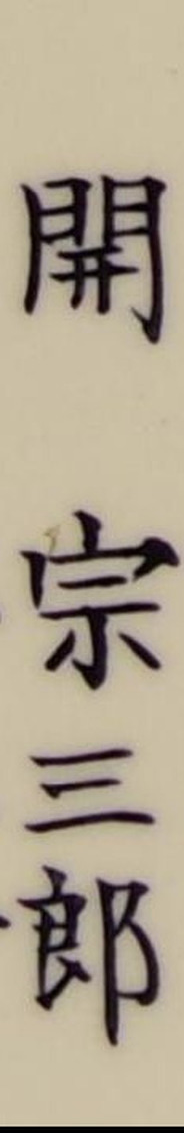開宗三郎
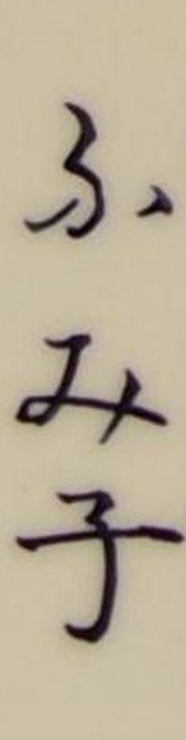ふみ子
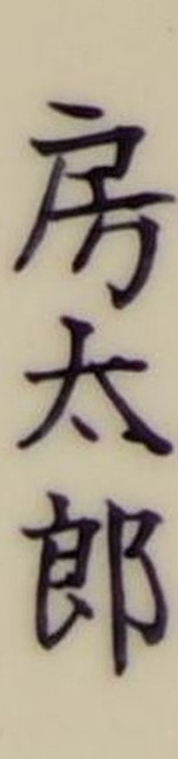房太郎
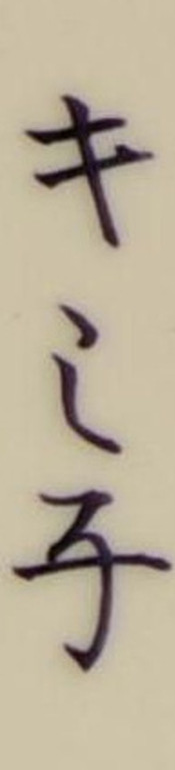キみ子
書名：E~L
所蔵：高野山金剛峯寺
